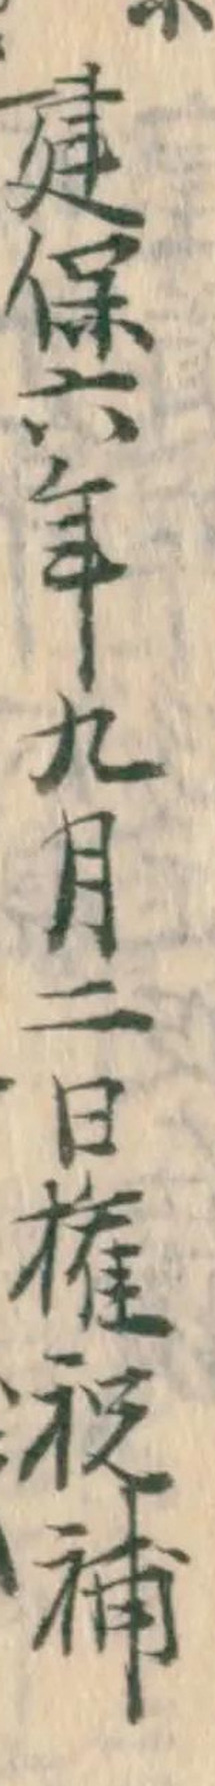建保六年九月二日権祝補
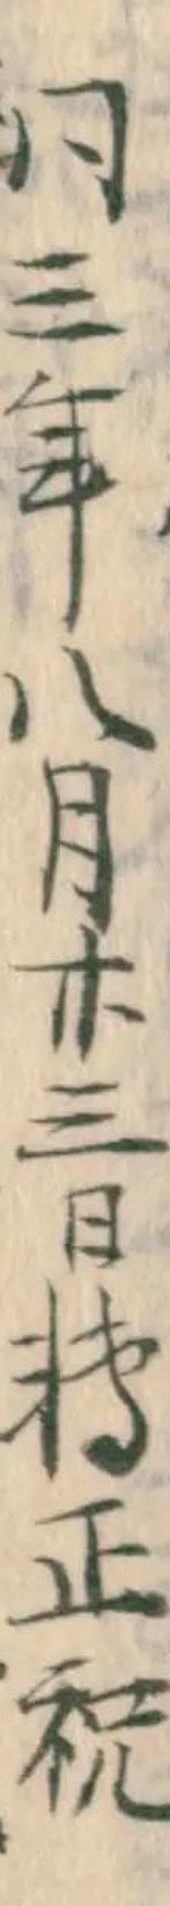同三年八月廿三日転正祝
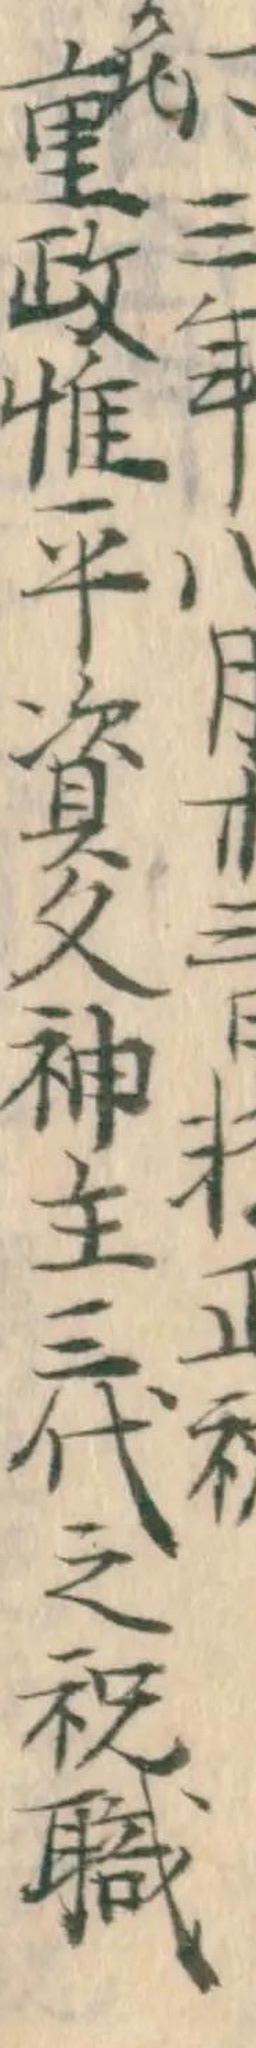重政惟平資久神主三代之祝職
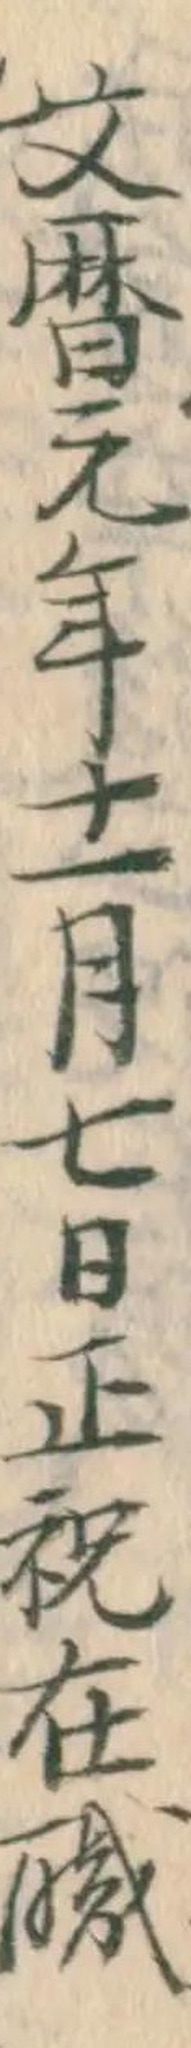保高文暦元年十一月七日正祝在職
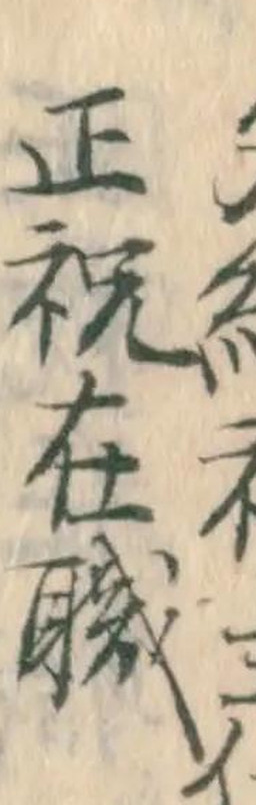正祝在職
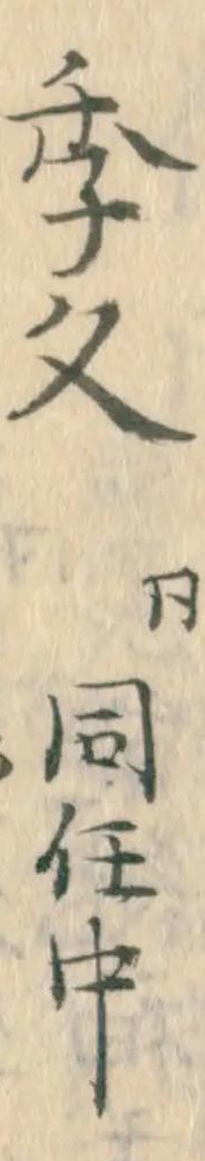季久同任中

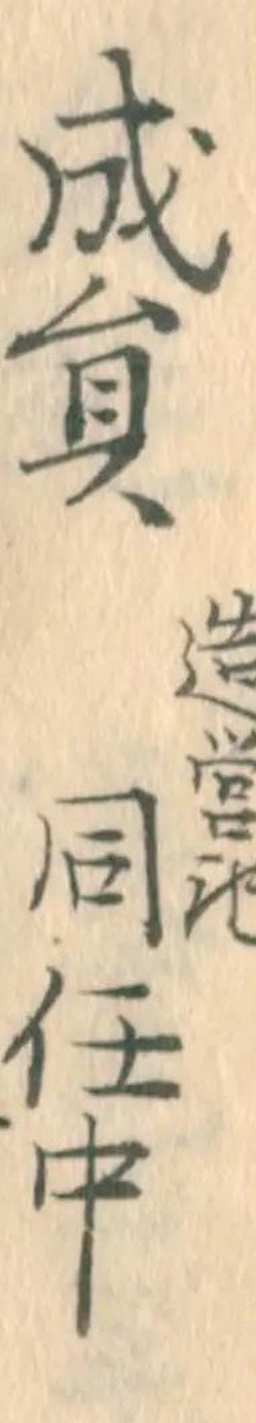重道同任中
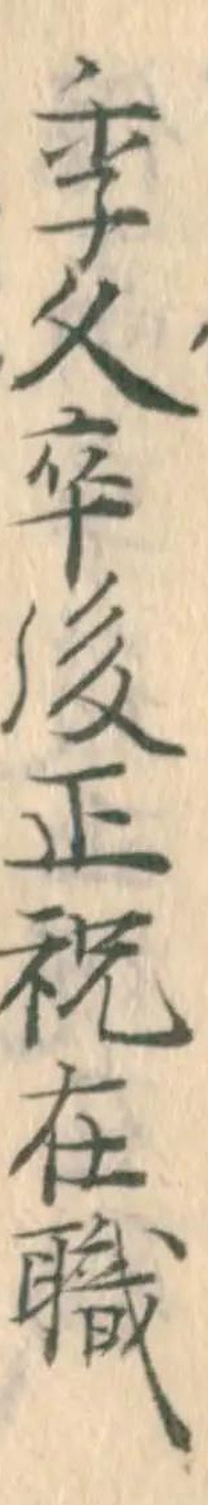季久卒後正祝在職
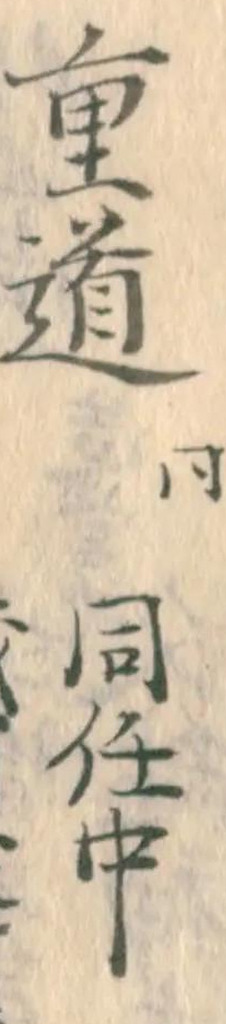重道同任中
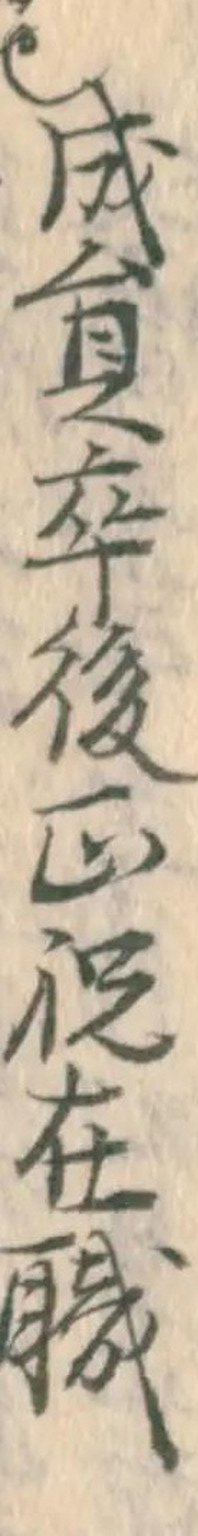季久卒後正祝在職
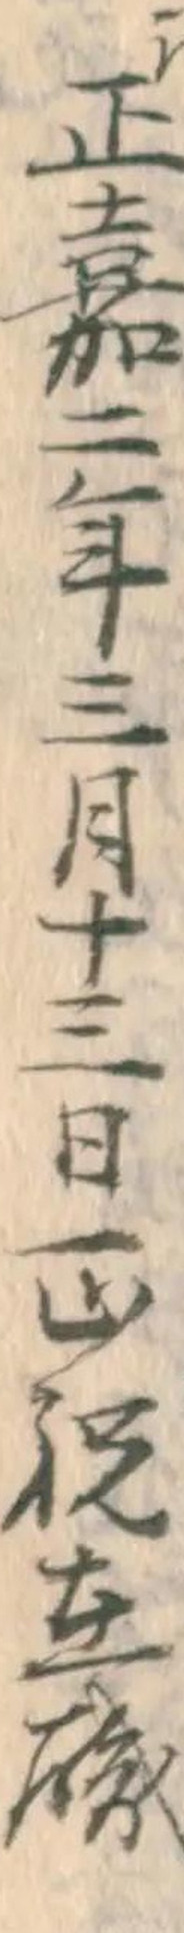正嘉二年三月十三日正祝在職
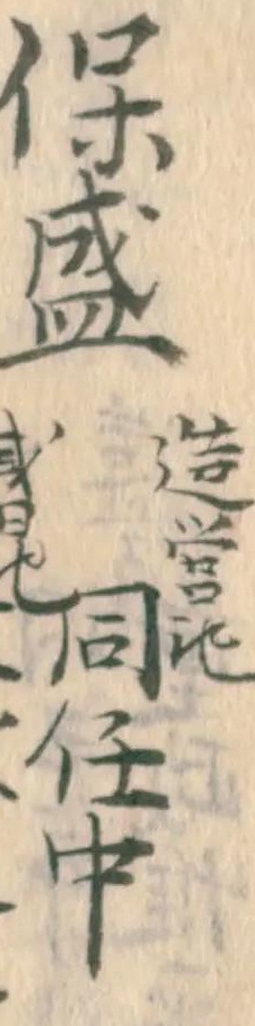重道同任中
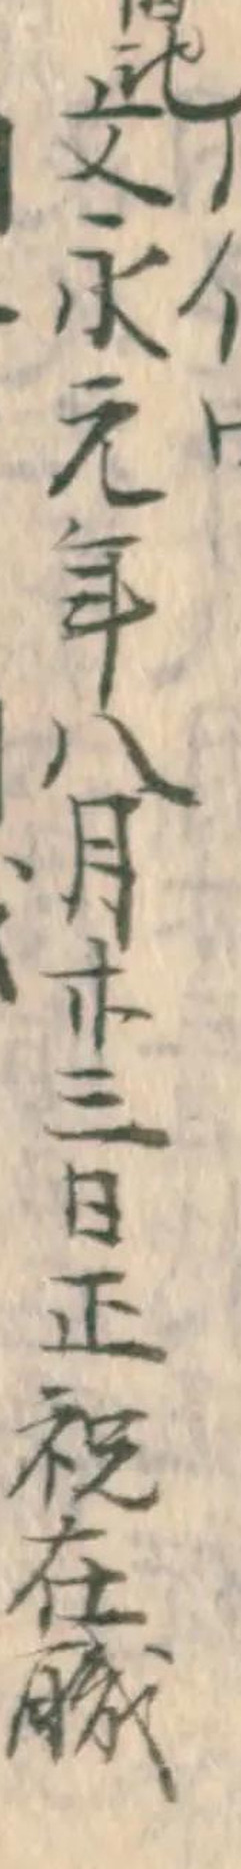文永元年八月廿三日正祝在職
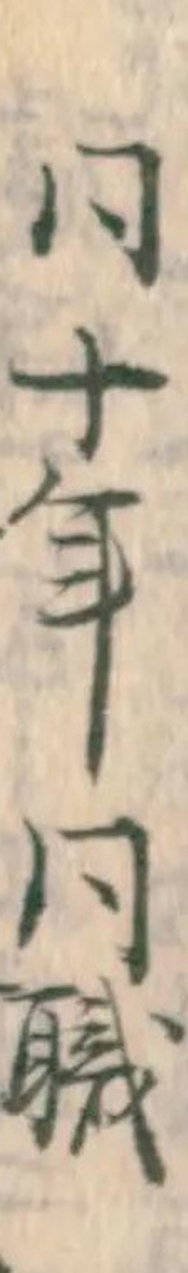同十年同職
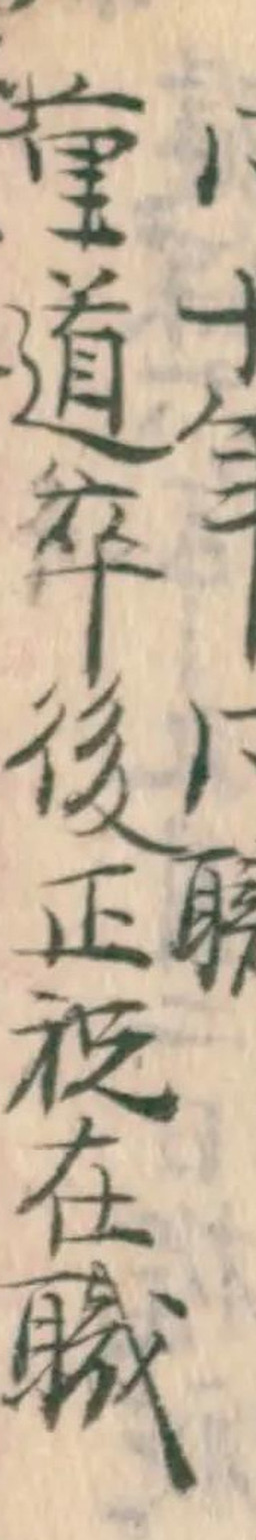重道卒後正祝在職
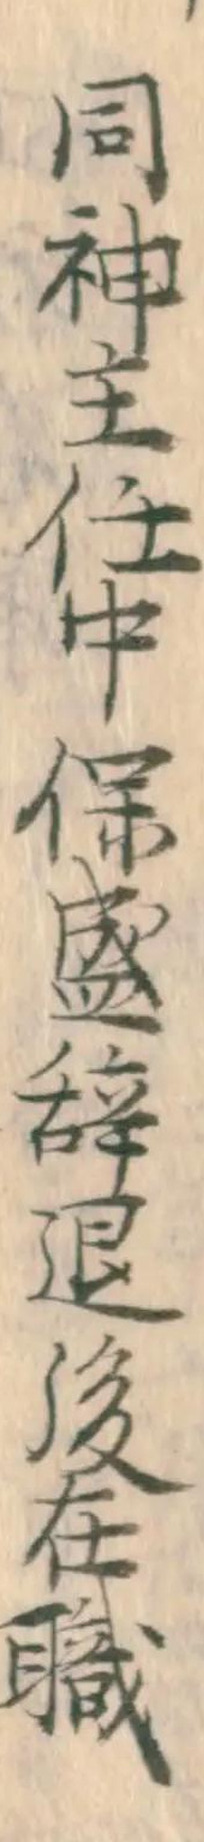久高同神主任中保盛辞退後在職
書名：賀茂社記録. 第23冊
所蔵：国立国会図書館 National Diet Library, JAPAN
